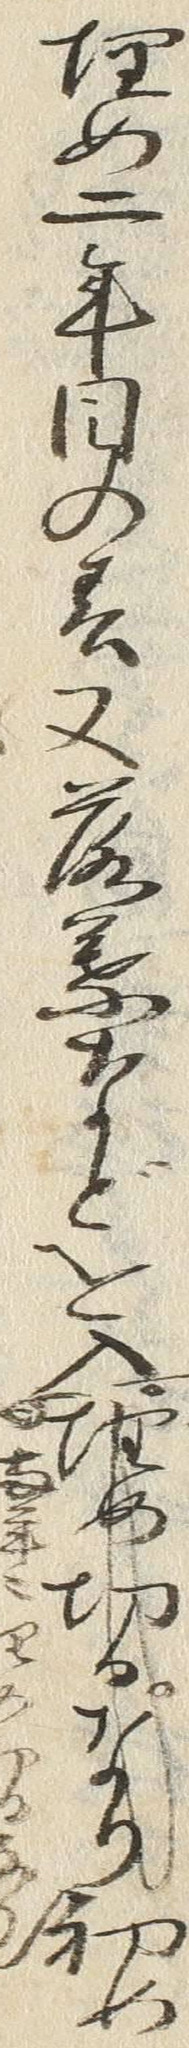埋め二年目の春又落葉などを入両年に埋め切るなり初め
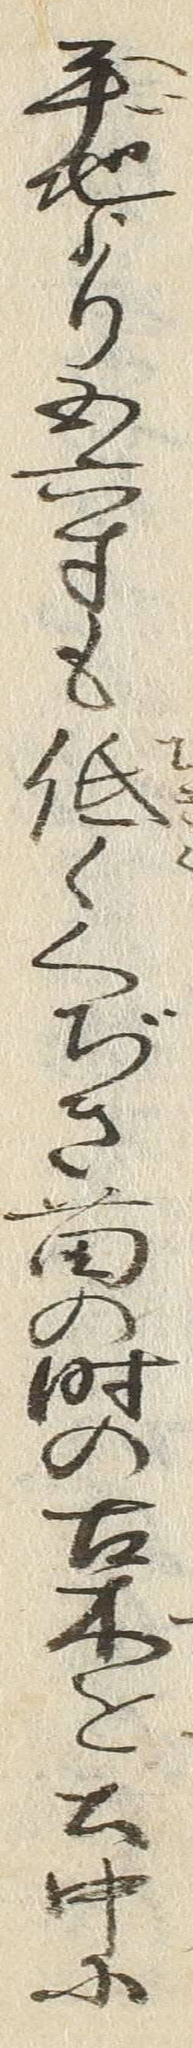平地より五六寸も低くくじき前の時の古木を土中尓
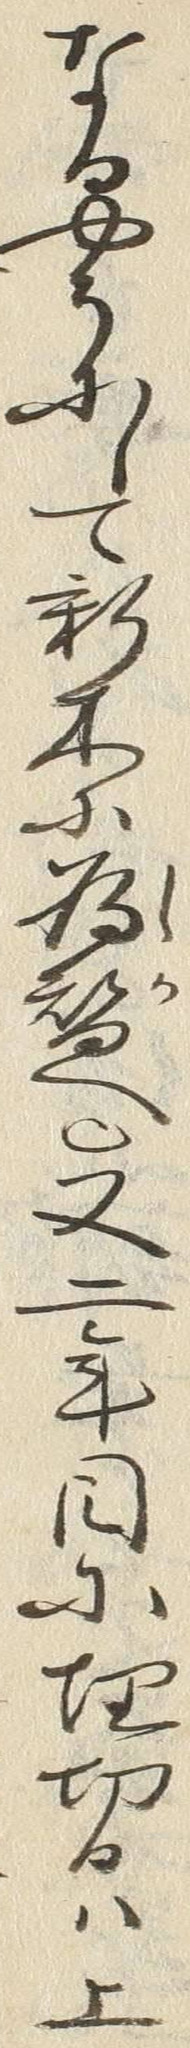なるやう尓して新木尓為替へ〇又二年目尓埋切るは上
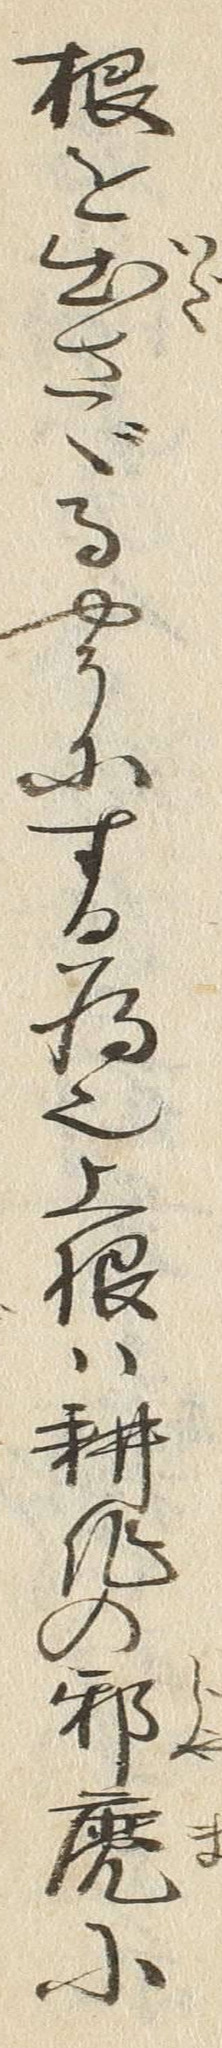根を出さゞるやう尓する為也上根は耕作の邪魔尓
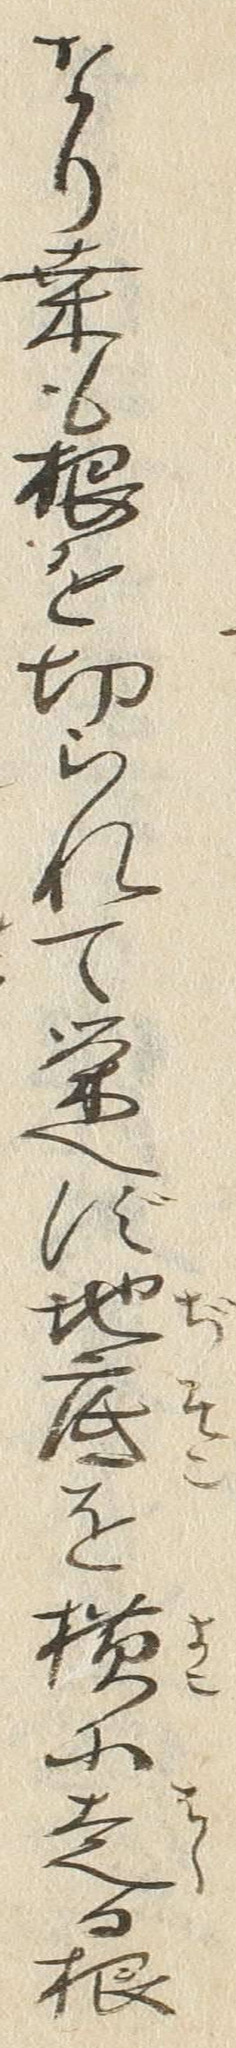なり桑も根を切られて栄へず地底を横尓走る根
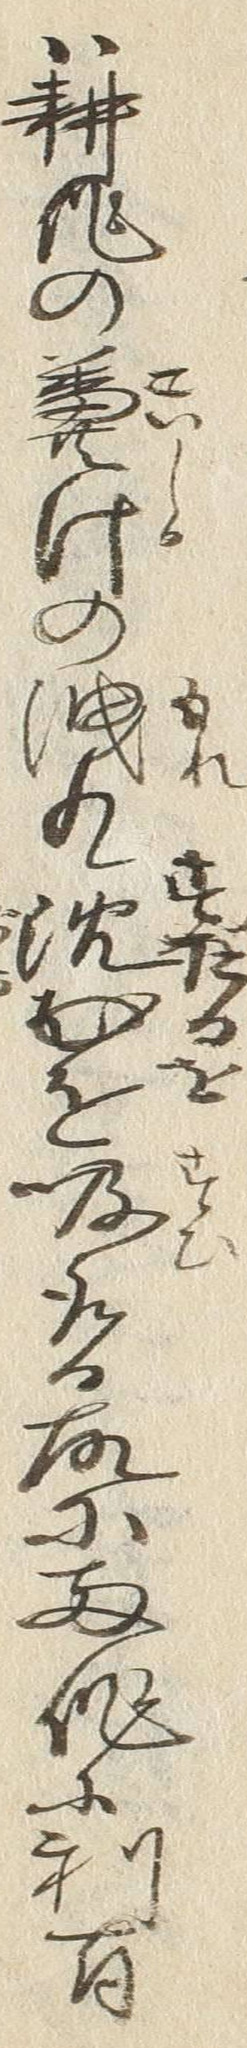は耕作の糞汁の洩沈を吸取る故尓両作尓利有
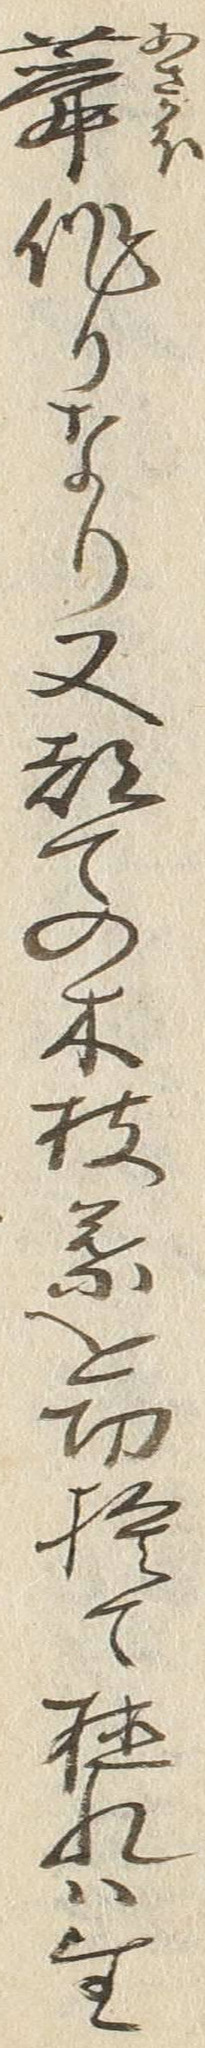蕣作りとなり又都ての木枝葉を切捨て植れは生
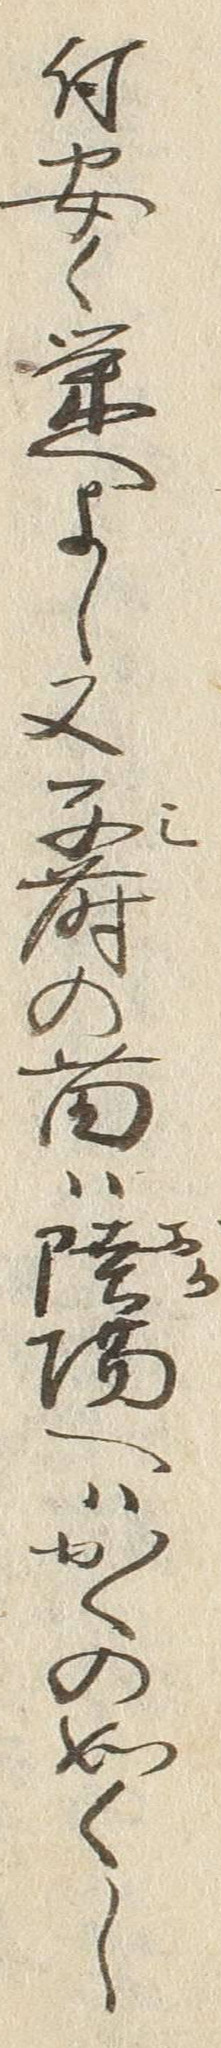付安く栄へよし又子蒔の苗は陸場へはかくの如くし
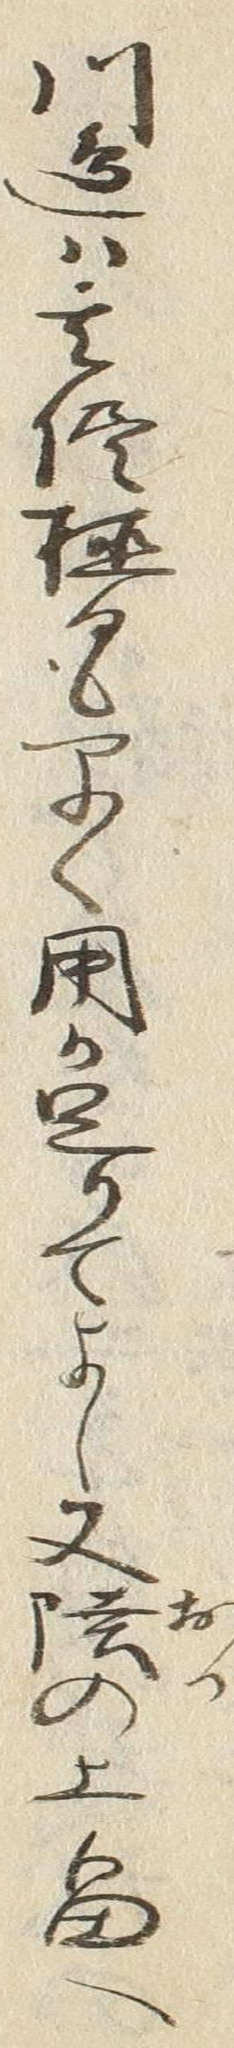川邊は其儘植るも早く用か足りてよし又陸の上畠へ
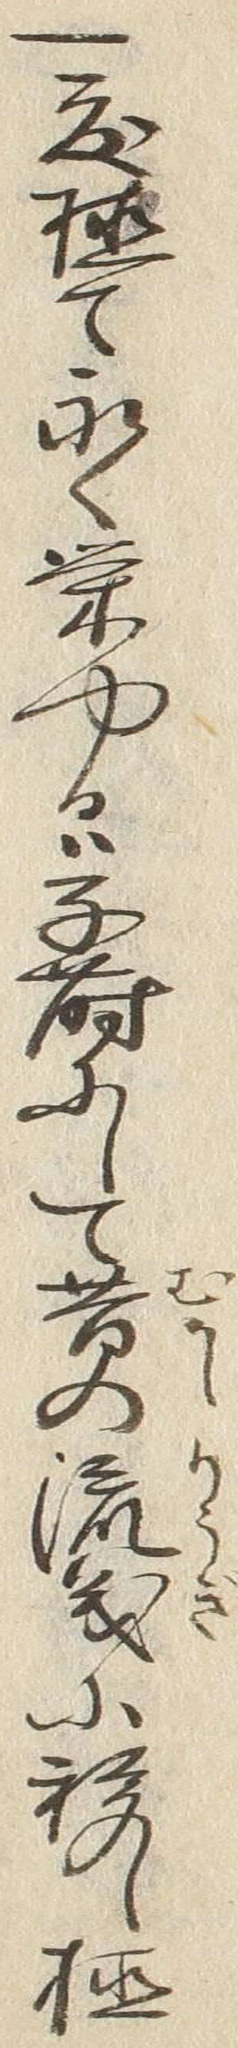一度植て永く栄ゆるは子蒔尓して昔の流義尓移し植
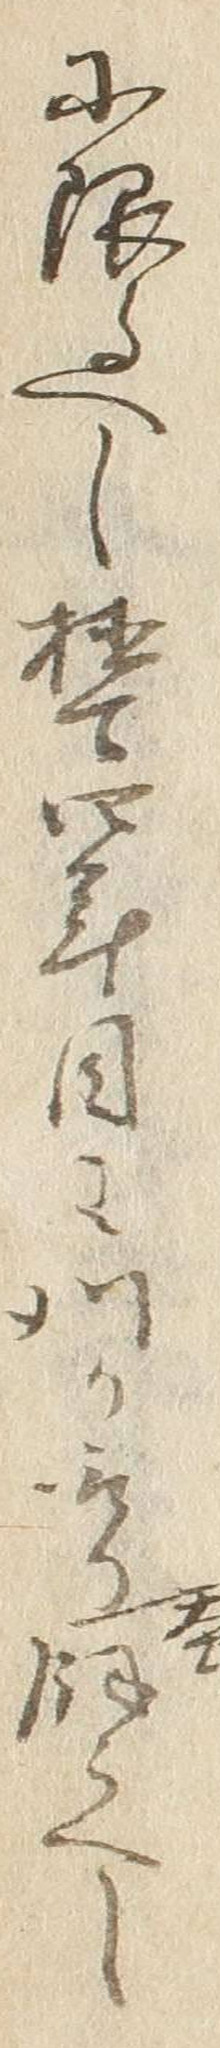尓限るへし植て四年目尓刈り取り蚕に飼うへし

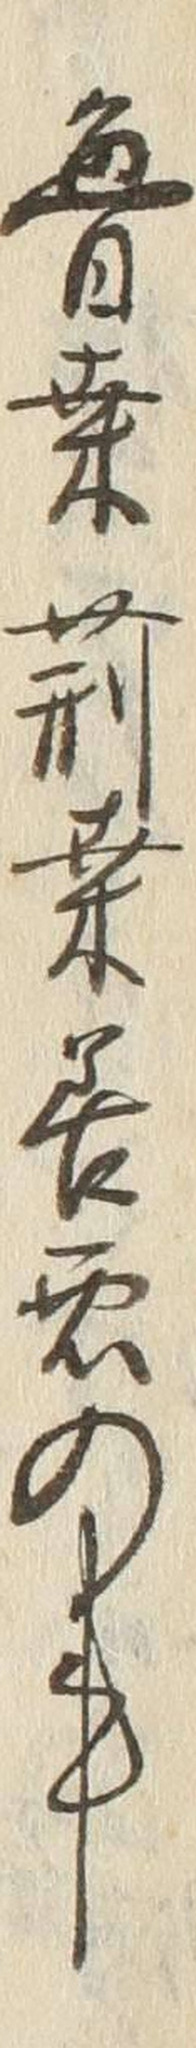魯桑荊桑善悪の事
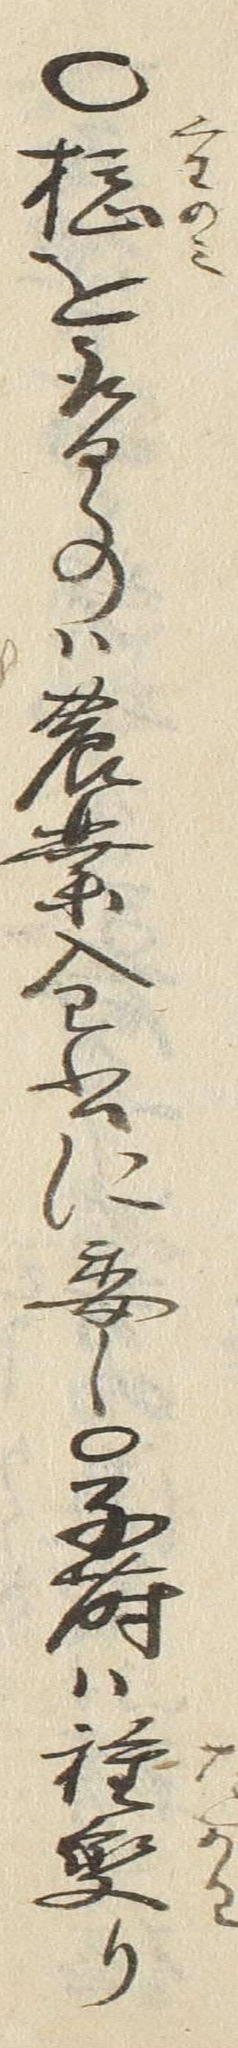〇椹を取る亊は農業全書に委し〇子蒔は種変り
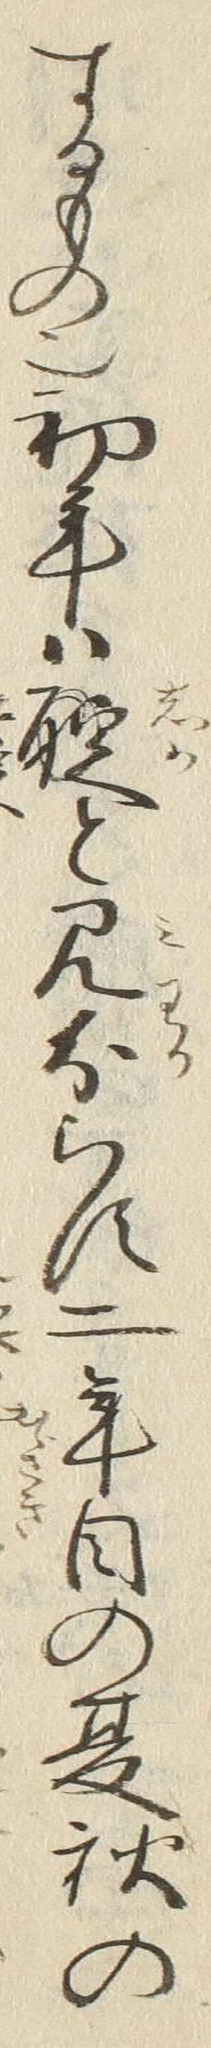するもの也初年は聢と見分ら須二年目の夏秋の
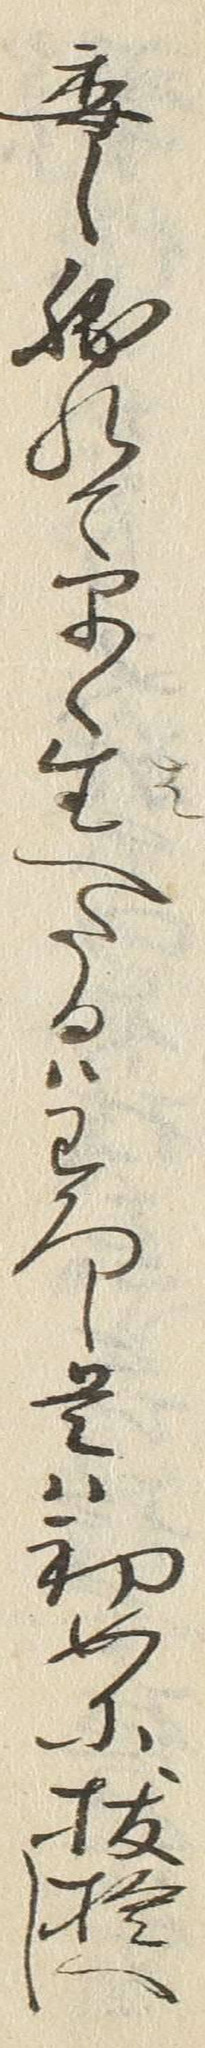委し勝れて早く生へたるはわろし是は初め尓抜捨へし
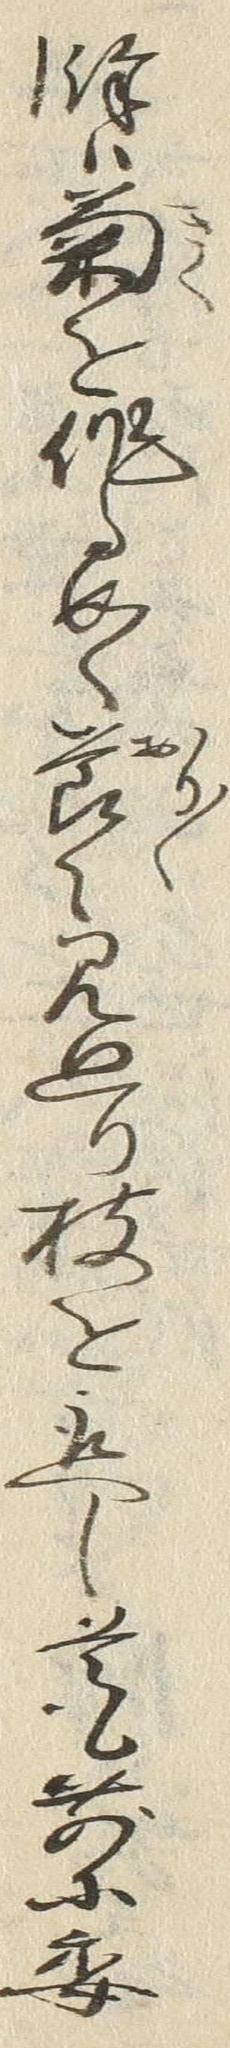餘は菊を作る如く節々見廻り枝を取へし是も前尓委
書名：養蠶實驗録後編
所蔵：東京大学農学生命科学図書館 国文学研究資料館
